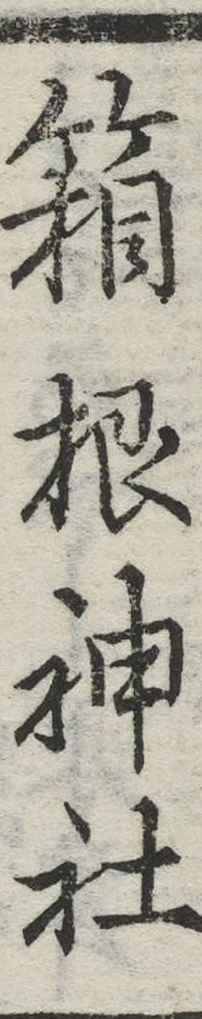箱根神社
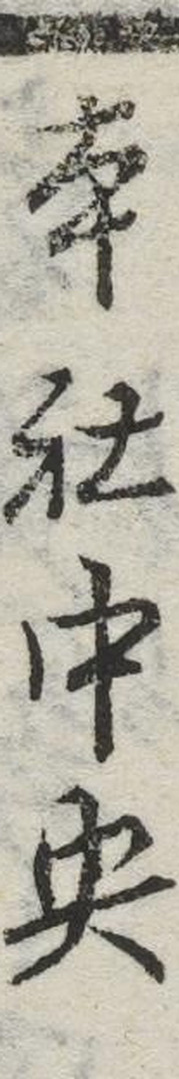本社中央
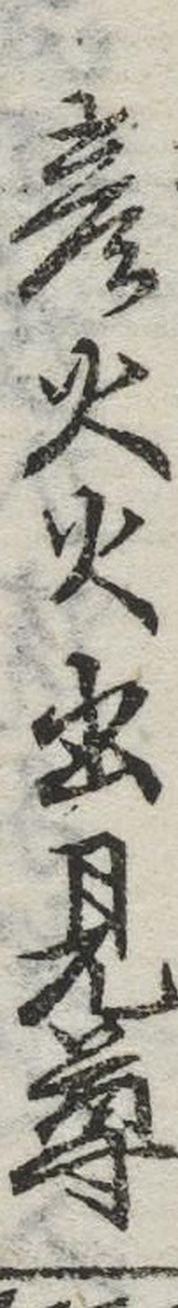彦火火出見尊
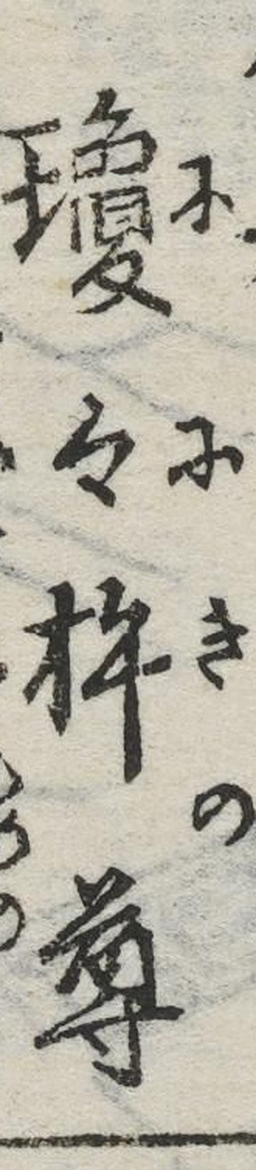瓊々杵尊
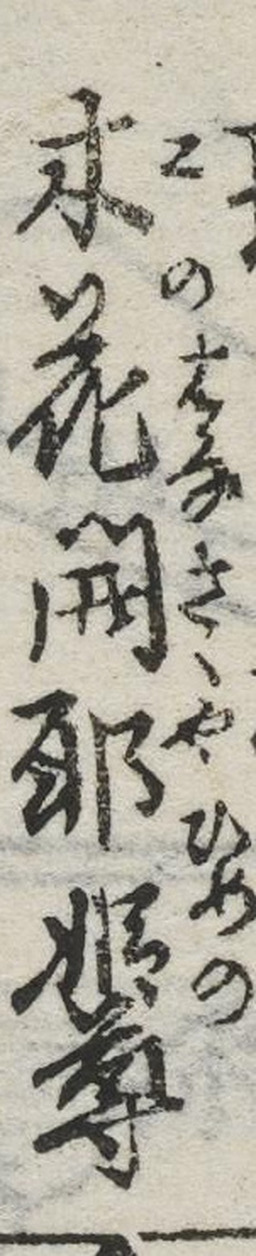木花開耶姫尊
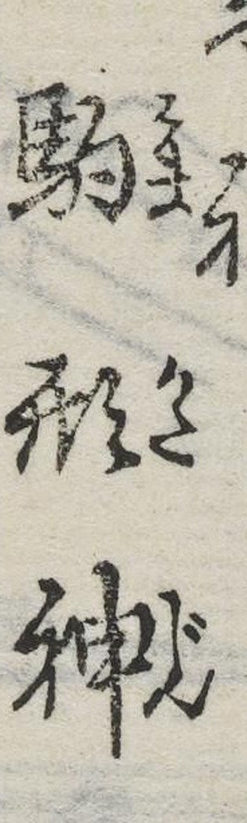駒形神
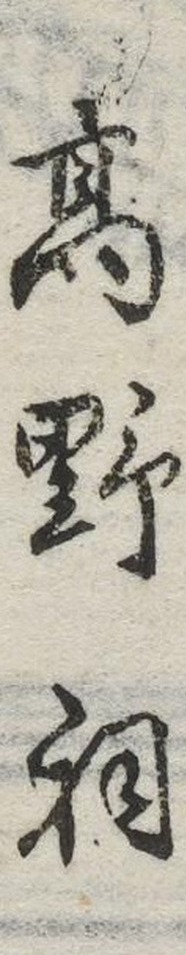高野祠

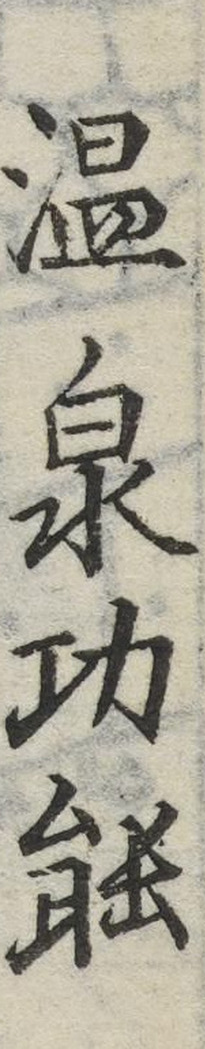温泉功能
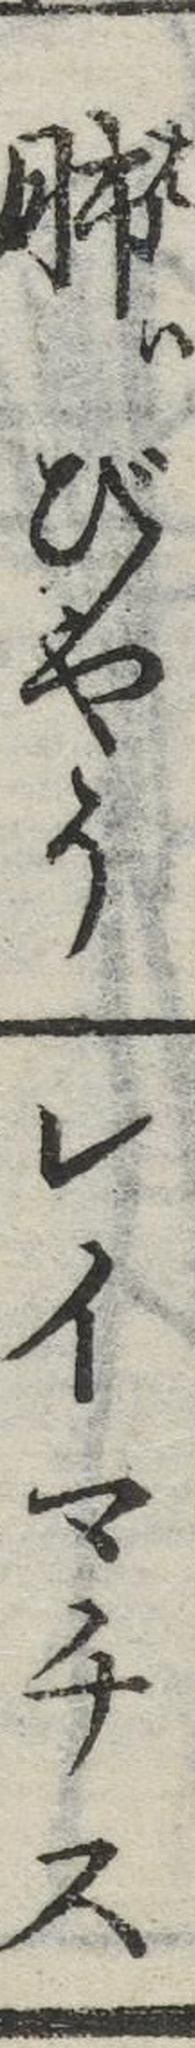肺びやうレイマチス
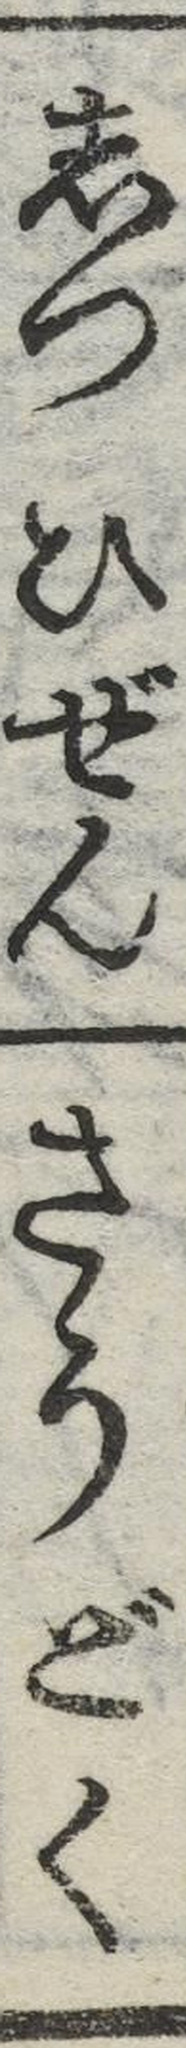しつひぜんさうどく
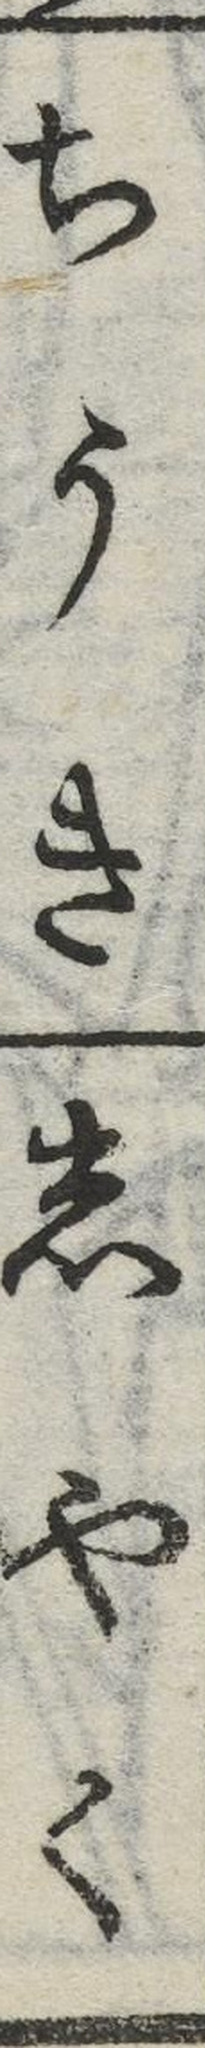ちうきしやく
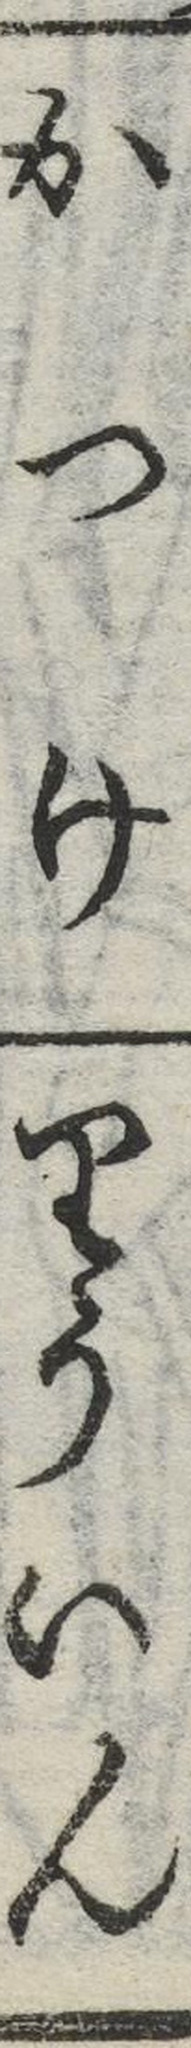かつけりういん
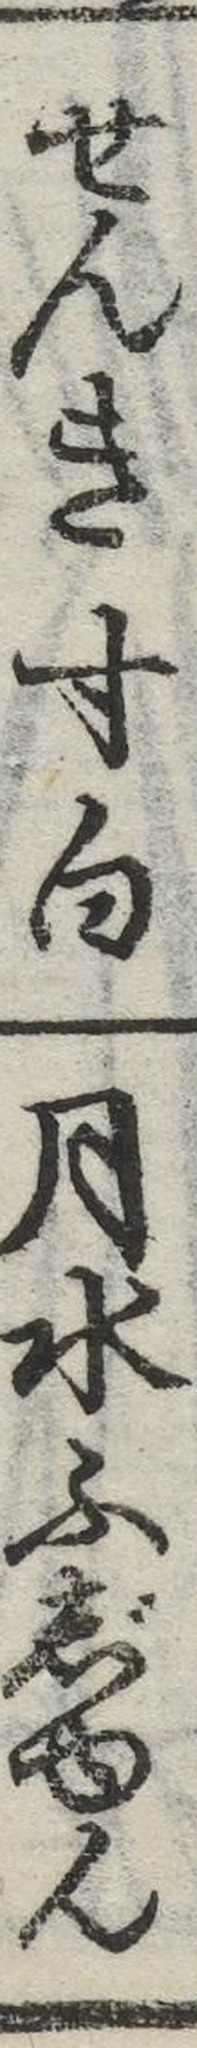せんき寸白月水ふじゆん
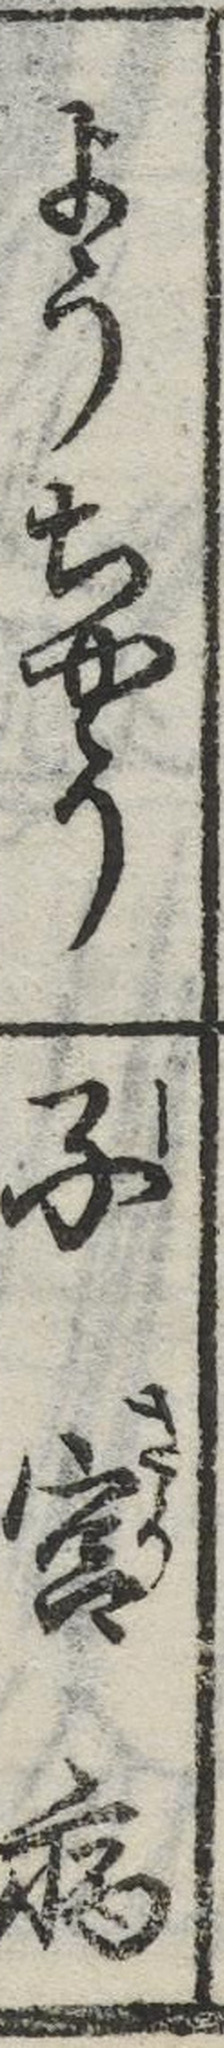ようちやう子宮病
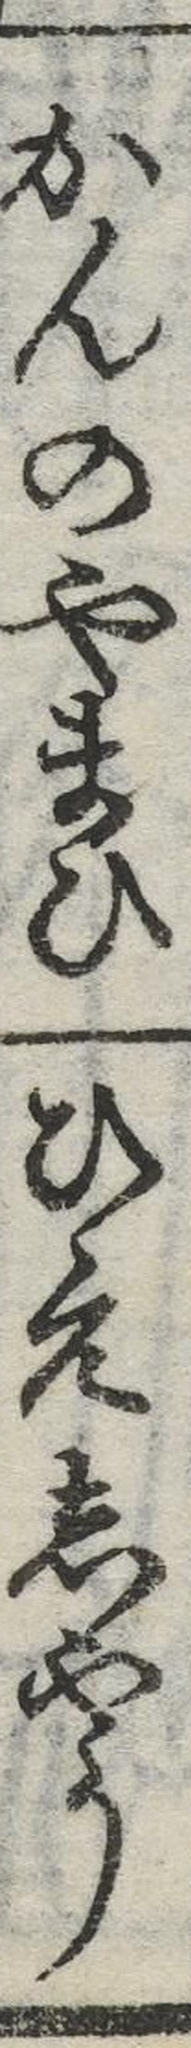かんのやまひひえしやう
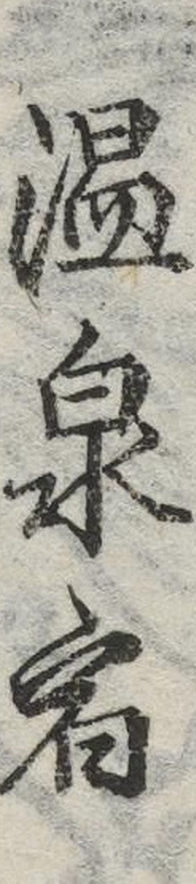温泉宿
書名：諸國温泉遊覽記　全
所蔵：東京大学地震研究所図書室 Earthquake Research Institute Library, The University of Tokyo, JAPAN
